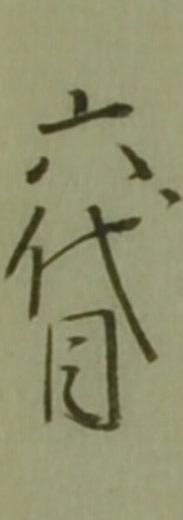六代目
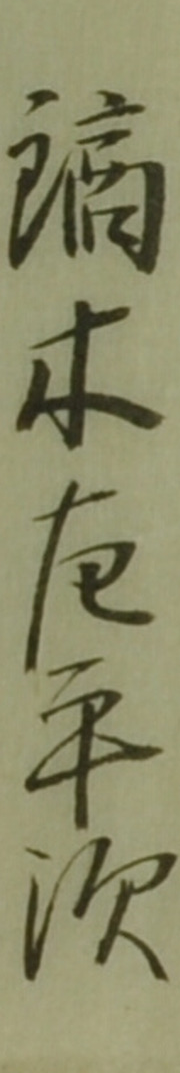鏑木左平次
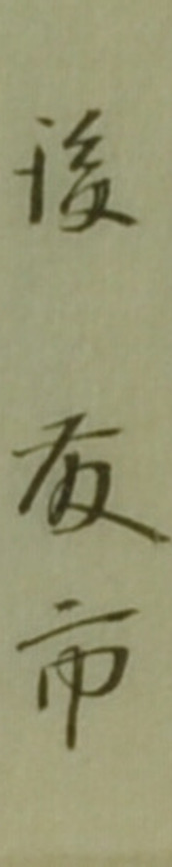後藤市
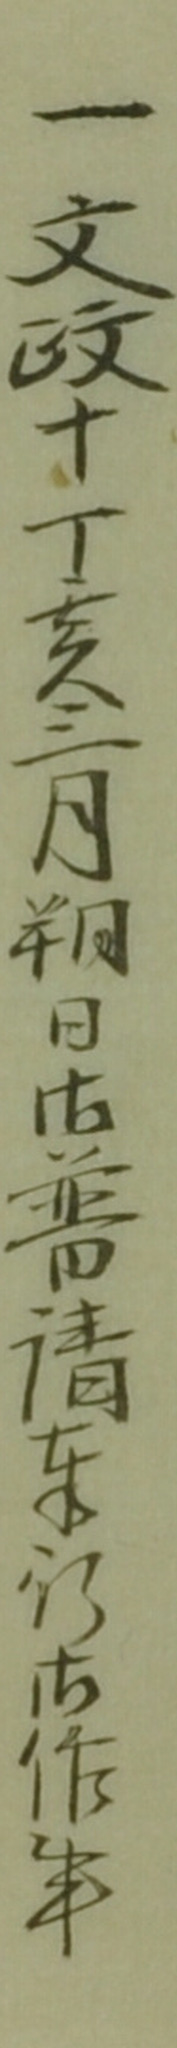一文政十丁亥三月朔日御普請奉行御作事
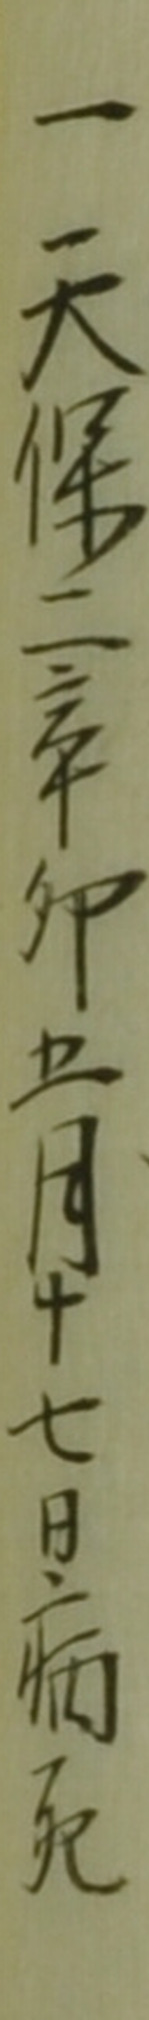一天保二辛卯五月十七日病死
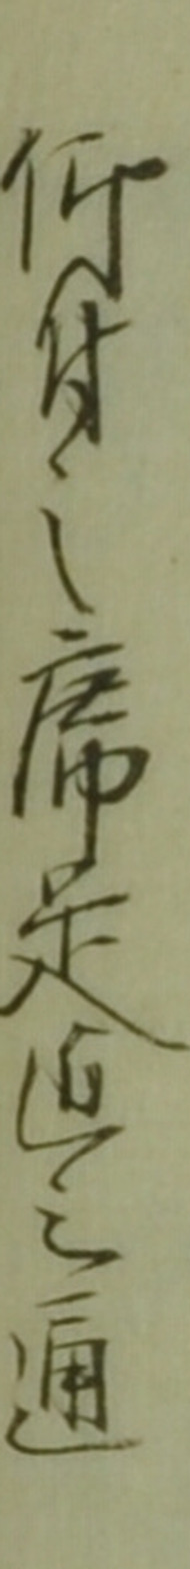仰付之席是迄之通
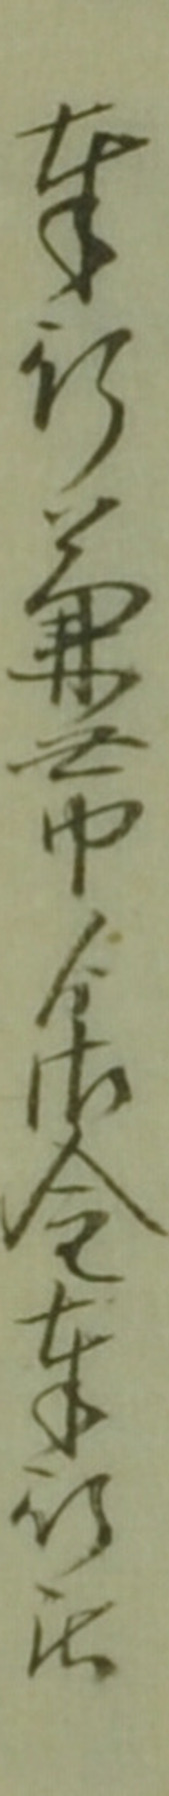奉行兼帯ゟ御金奉行被
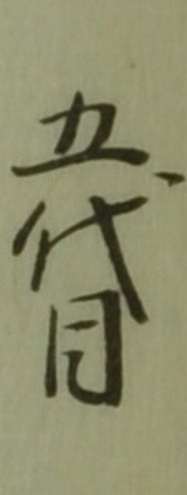五代目
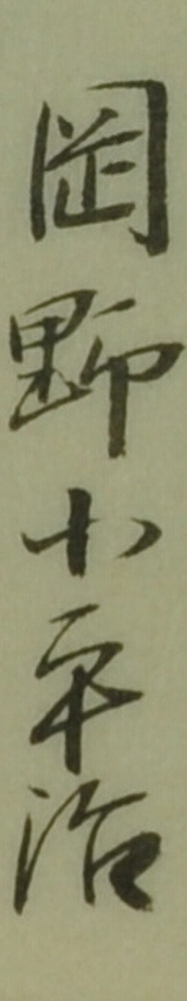岡野小平治
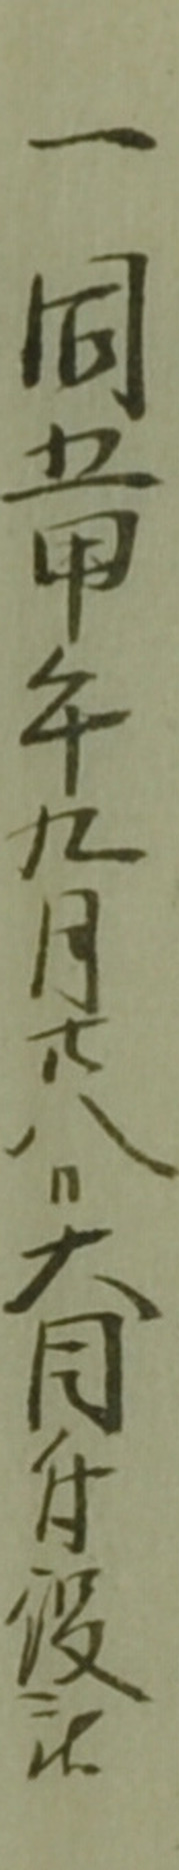一同五甲午九月廿八日大目付役被
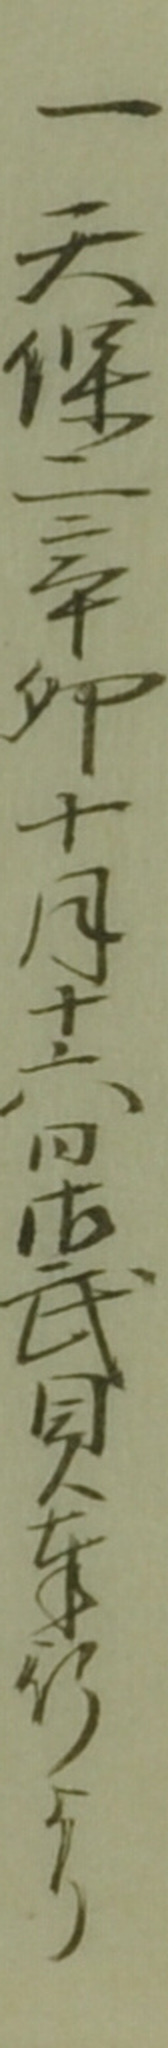一天保二辛卯十月十六日御武具奉行より
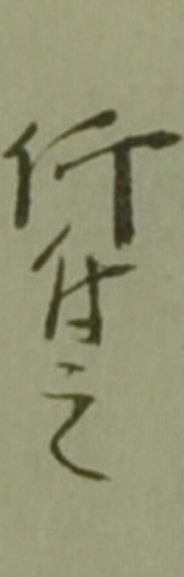仰付之
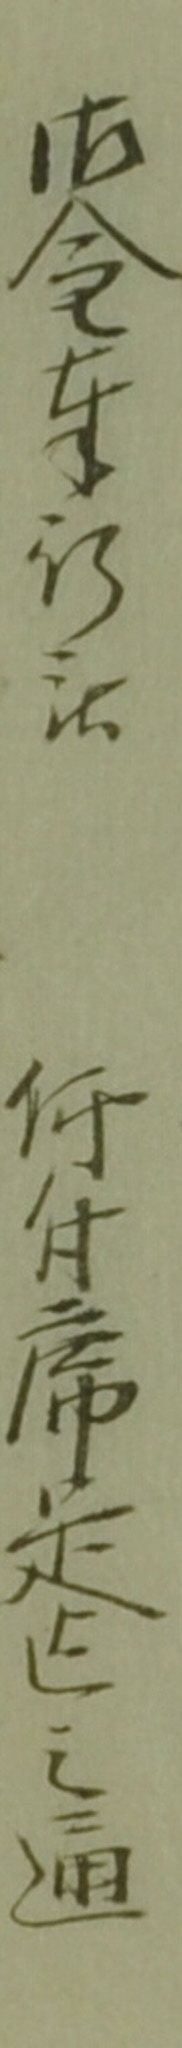御金奉行被仰付席是迄之通
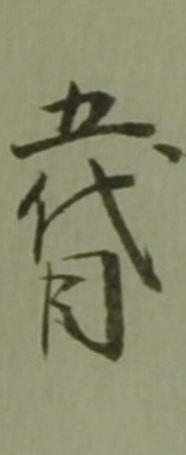五代目
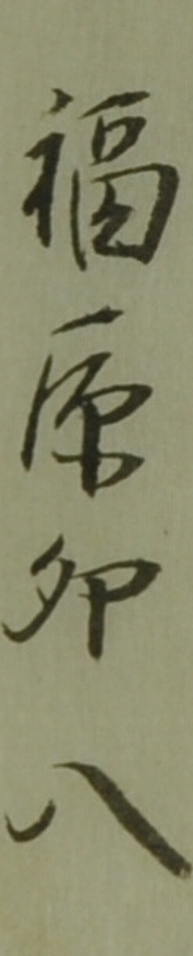福原卯八
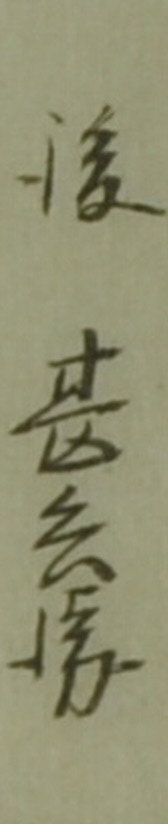後甚兵衛
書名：諸御役代々録（七）
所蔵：伊那市立高遠町図書館・合同会社AMANE
